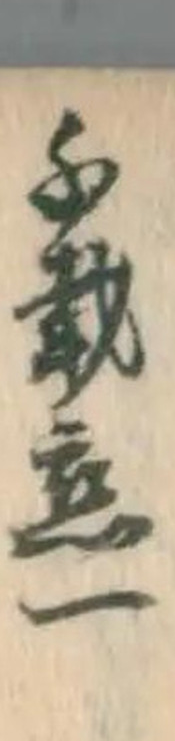千載恋一
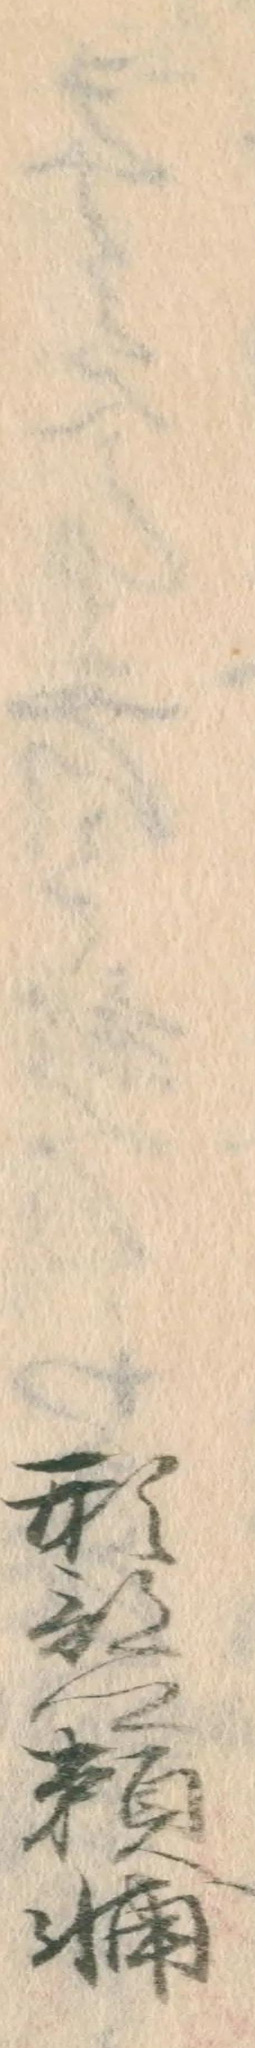形部卿頼輔
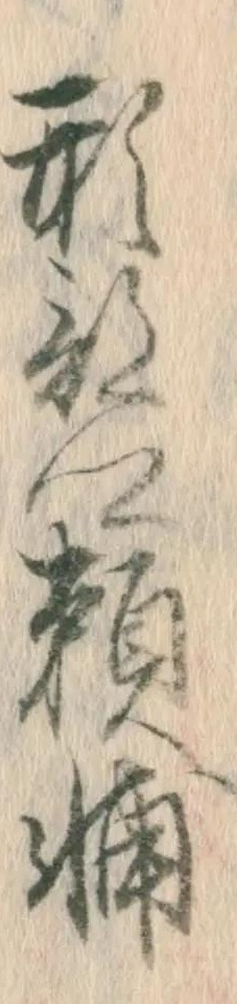形部卿頼輔
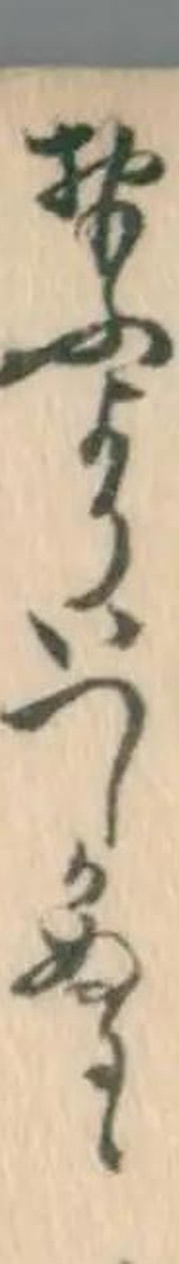おもふよりいつしかぬるゝ
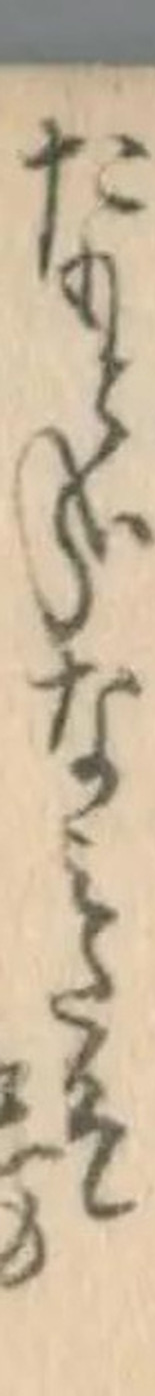たもと哉なみたそ
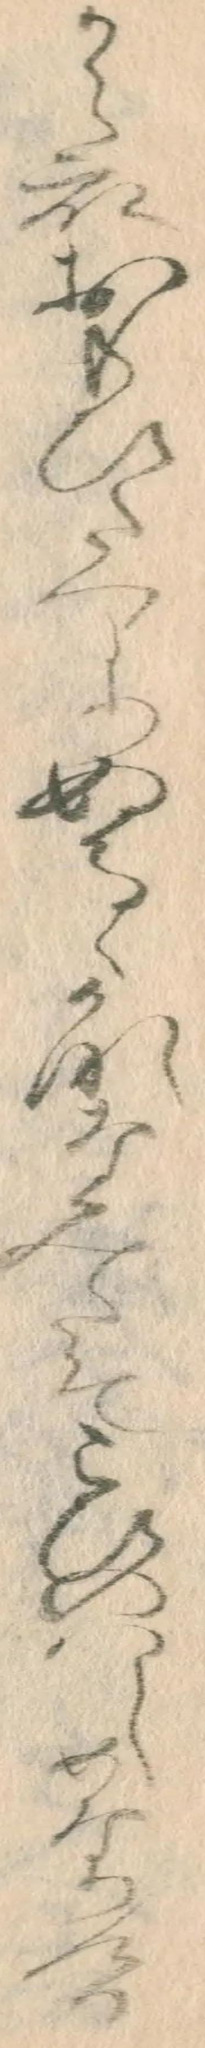から衣おもひたつよりぬるゝかななみたそこひのはしめなりける
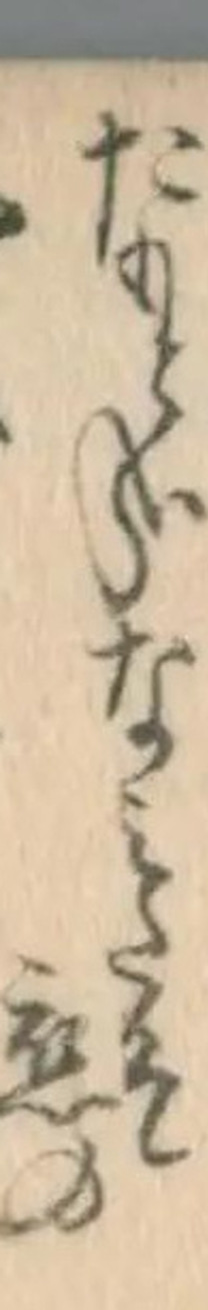たもと哉なみたそ
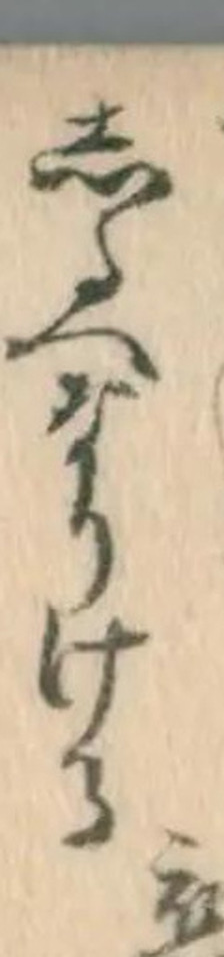しるへなりける
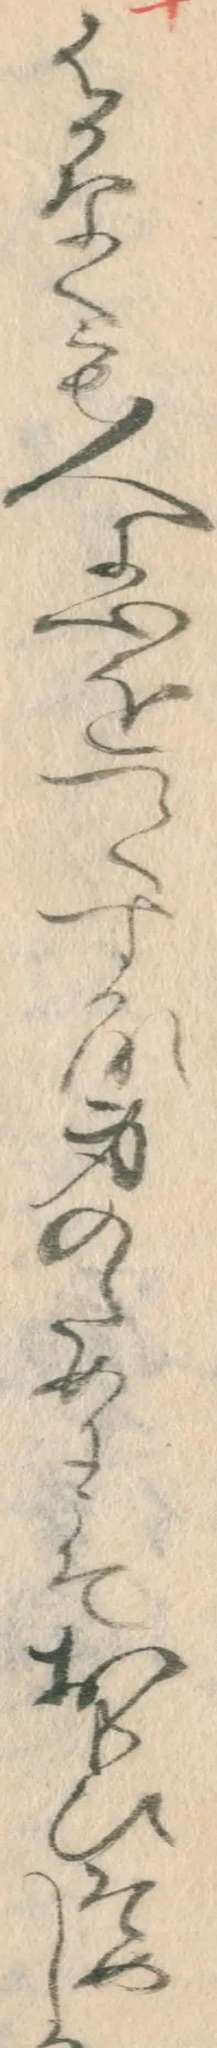はかなくも人に心をつくすかな身のためにこそおもひそめしか
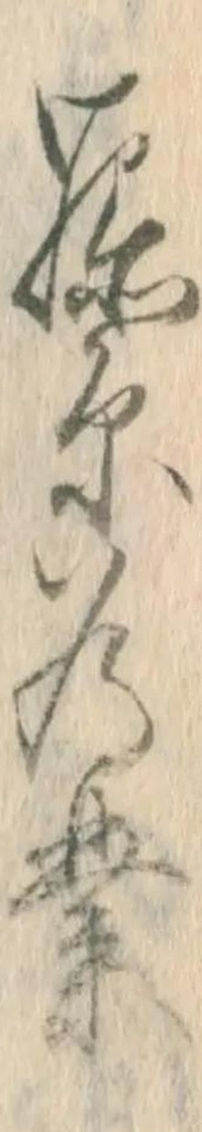藤原為業
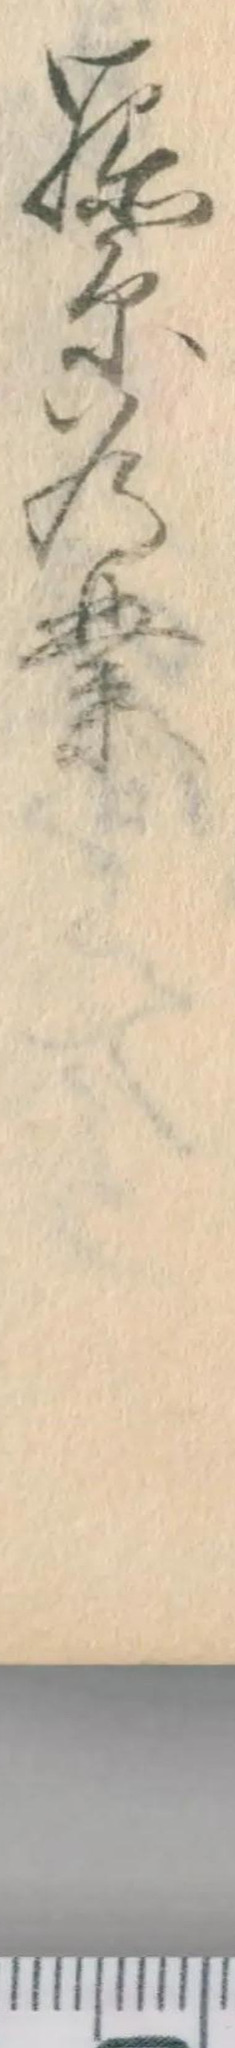藤原為業

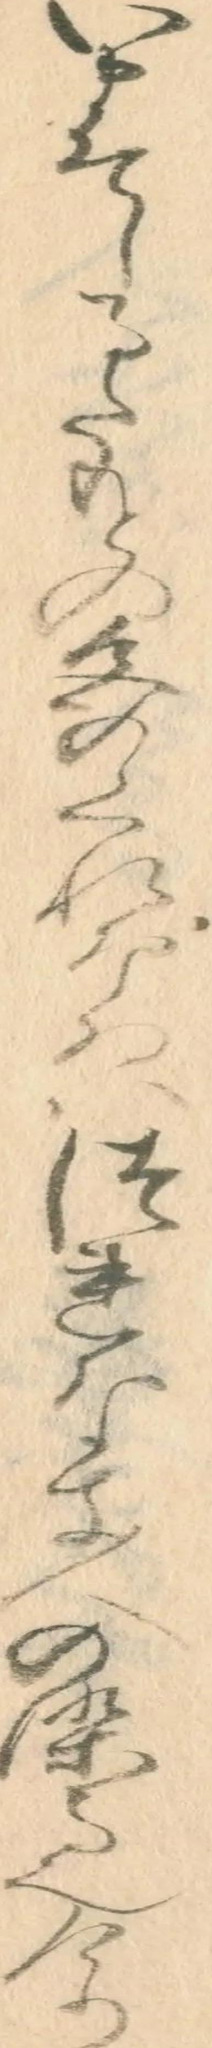いまそしるたもとの色のくれなゐはつれなき人の染る也けり
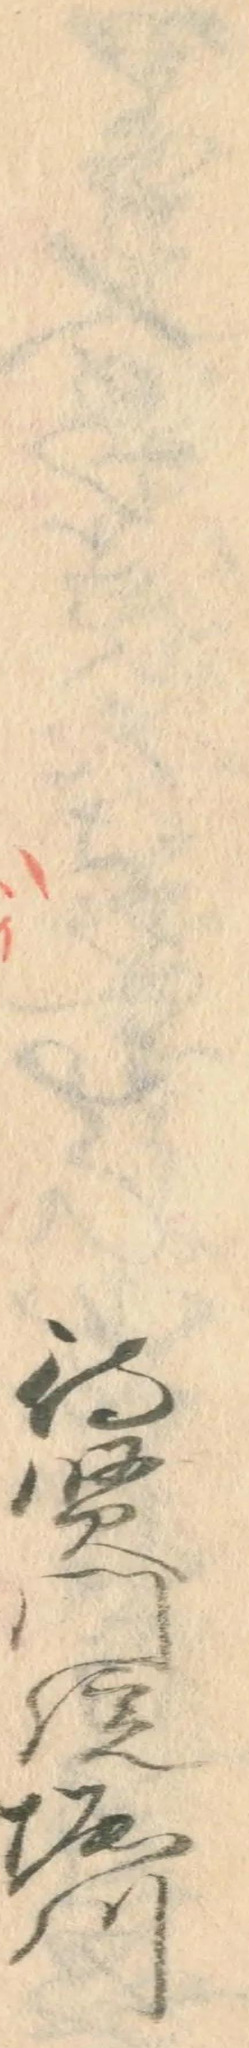待賢門院堀川
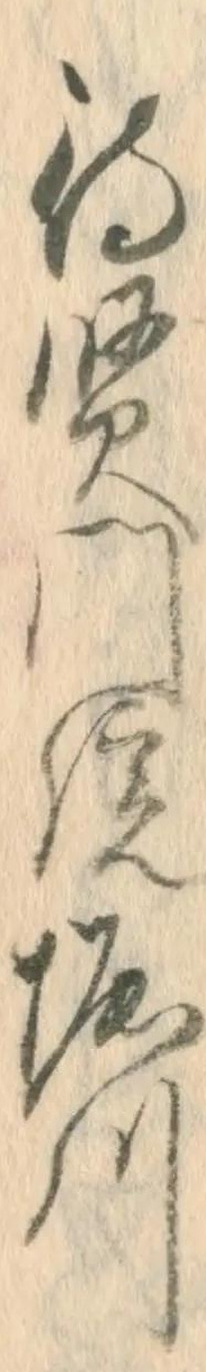待賢門院堀川
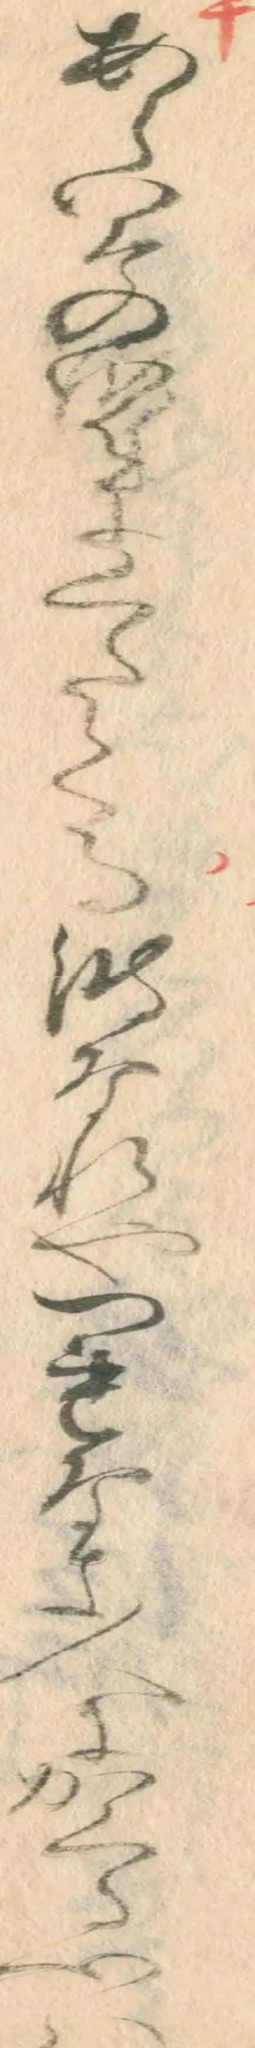あらいそのいはにくたくる波なれやつれなき人にかくる心は
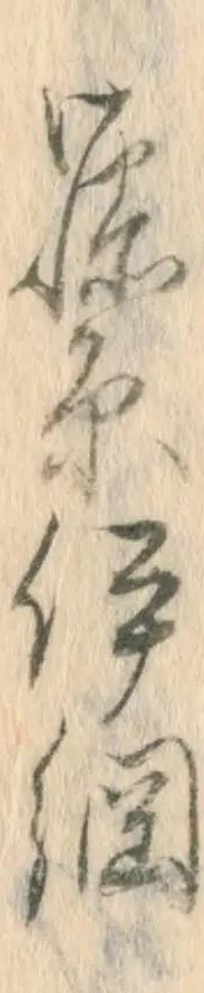藤原伊綱
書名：月詣和歌集
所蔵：国立国会図書館 National Diet Library, JAPAN
